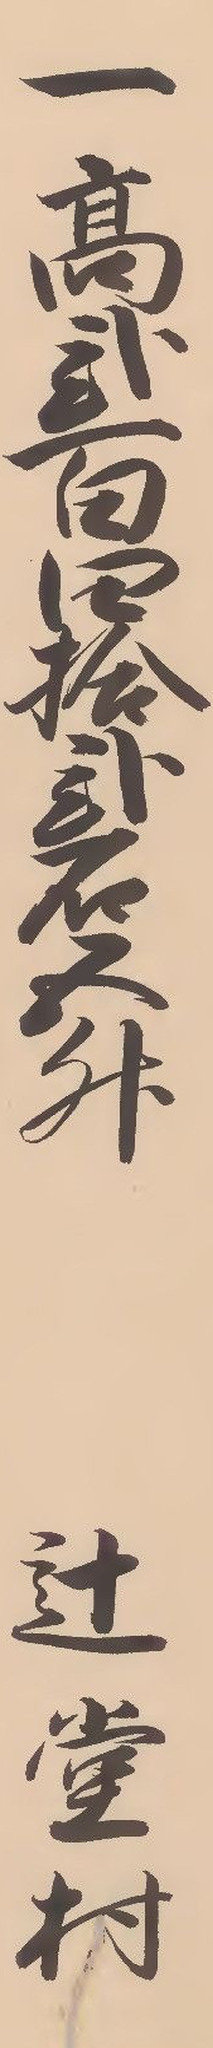一高弐百四拾弐石五升辻堂村
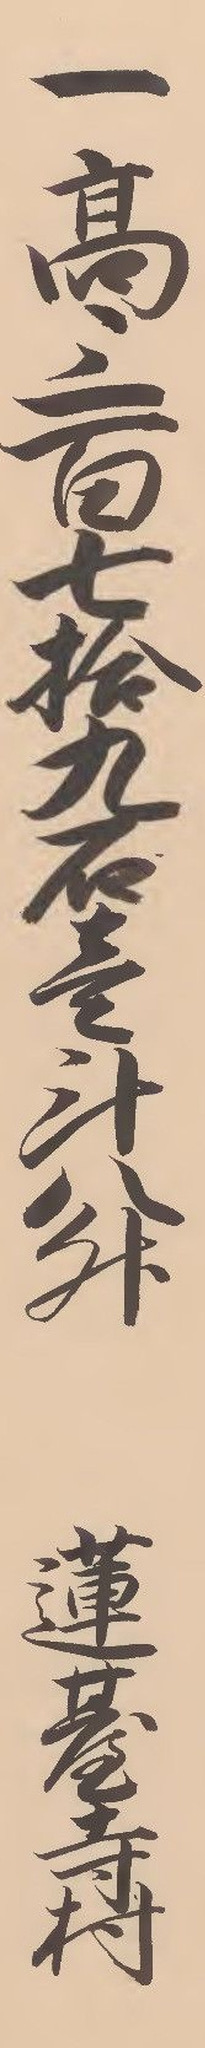一高三百七拾九石壱斗八升蓮台寺村

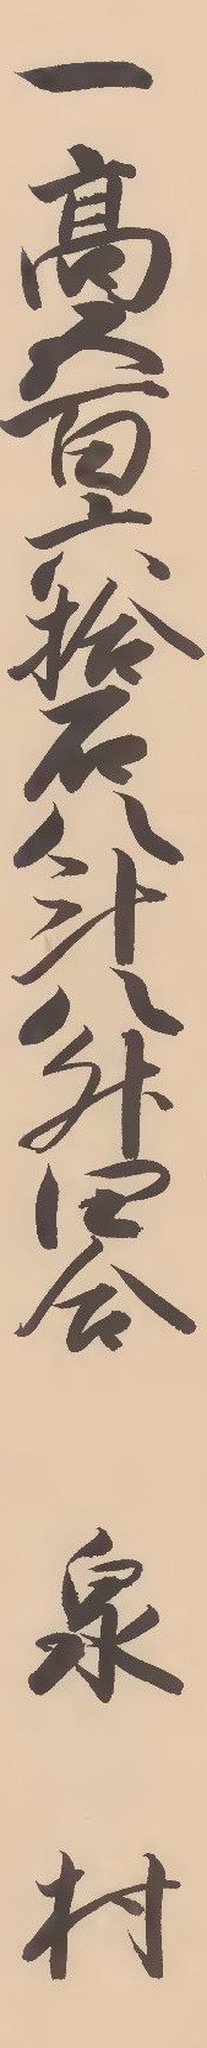一高五百六拾石八斗八升四合泉村
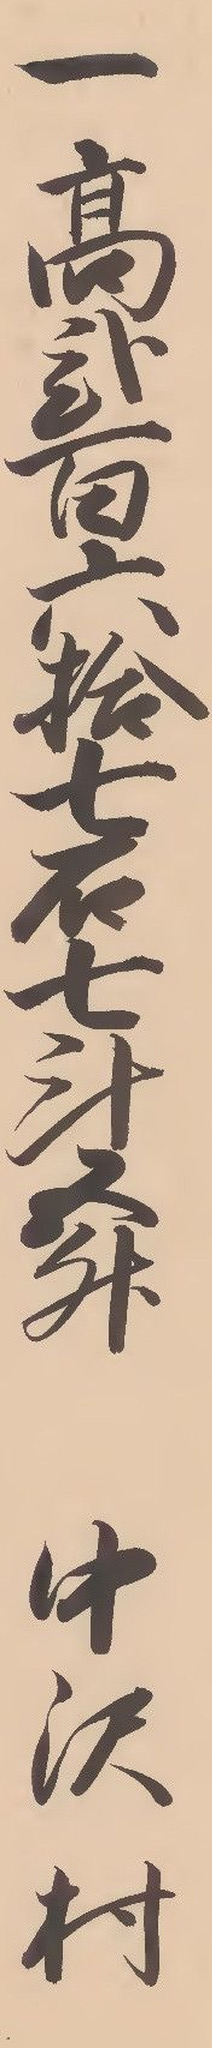一高弐百六拾七石七斗五升中沢村
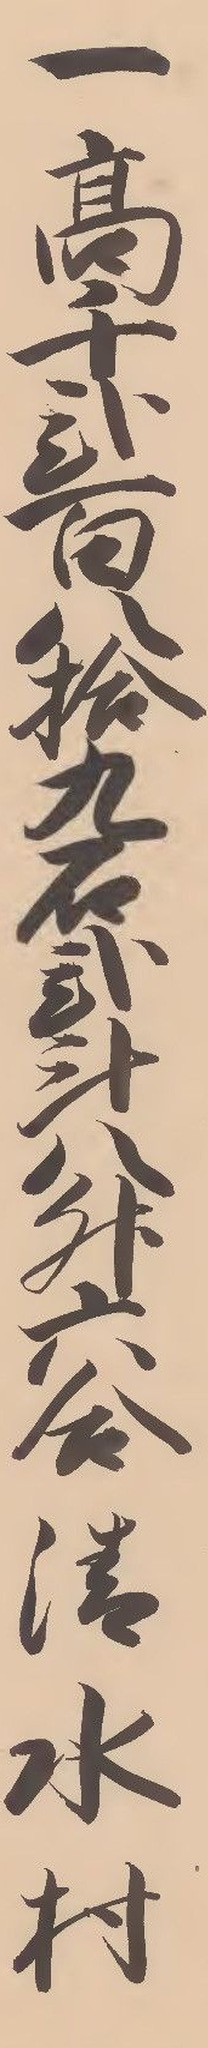一高千弐百八拾九石弐斗八升六合清水村
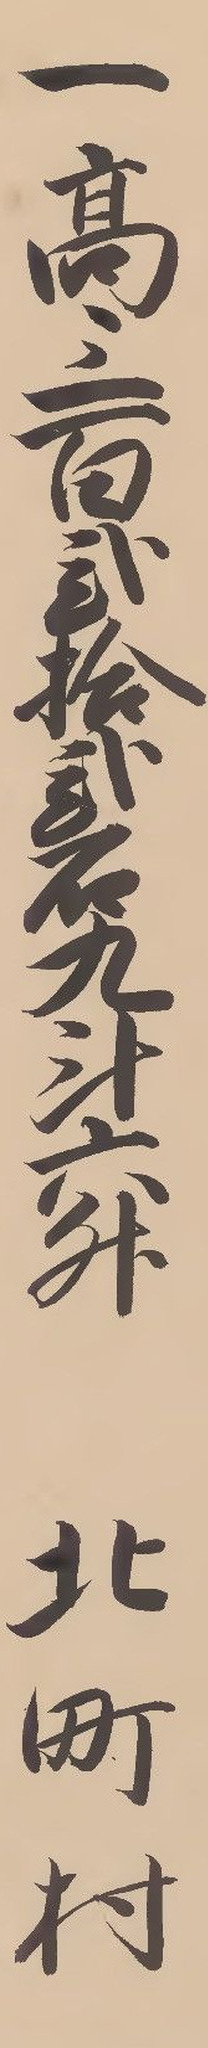一高三百弐拾弐石九斗六升北町村
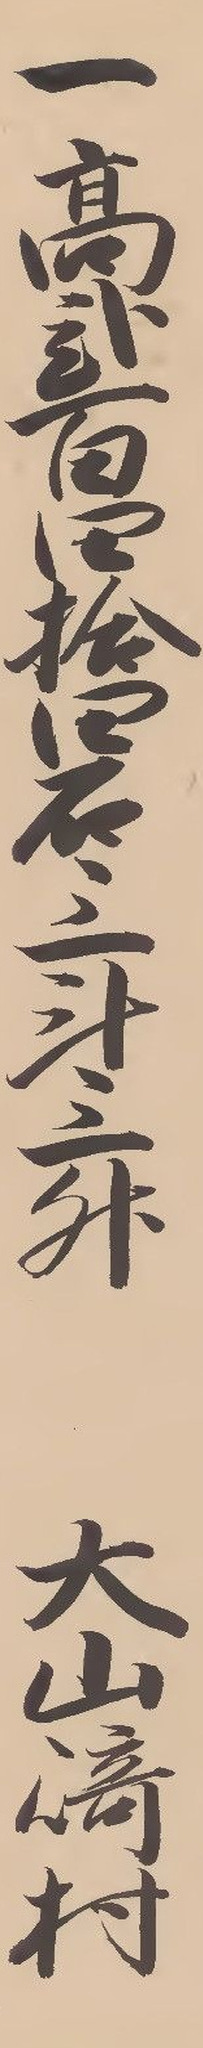一高弐百四拾四石三斗三升大山崎村
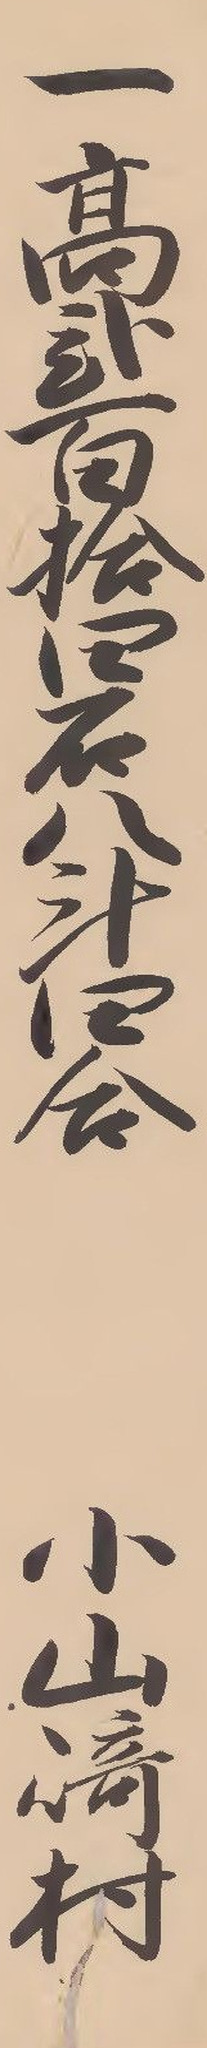一高弐百拾四石八斗四合小山崎村

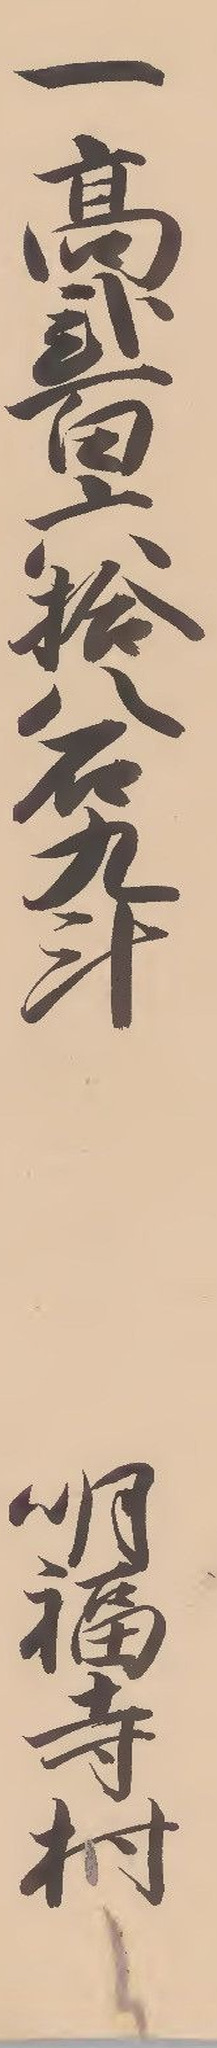一高弐百六拾八石九斗明福寺村
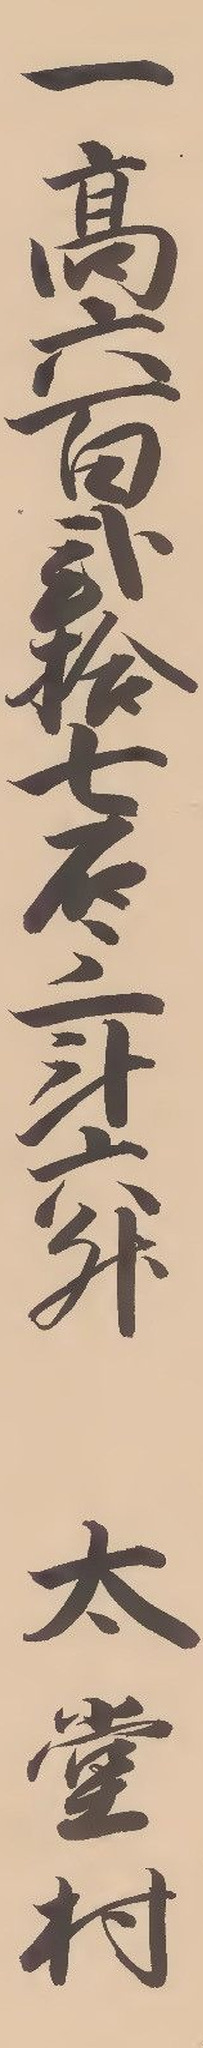一高六百弐拾七石三斗六升太堂村
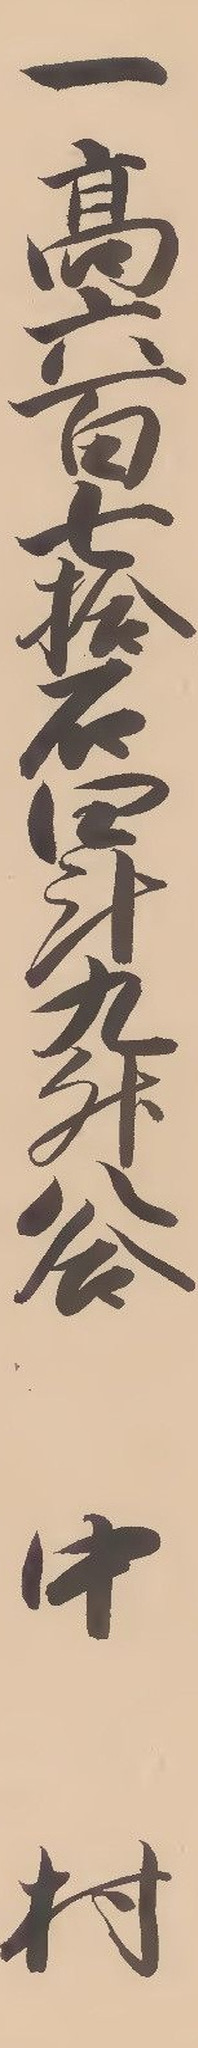一高六百七拾石四斗九升八合中村
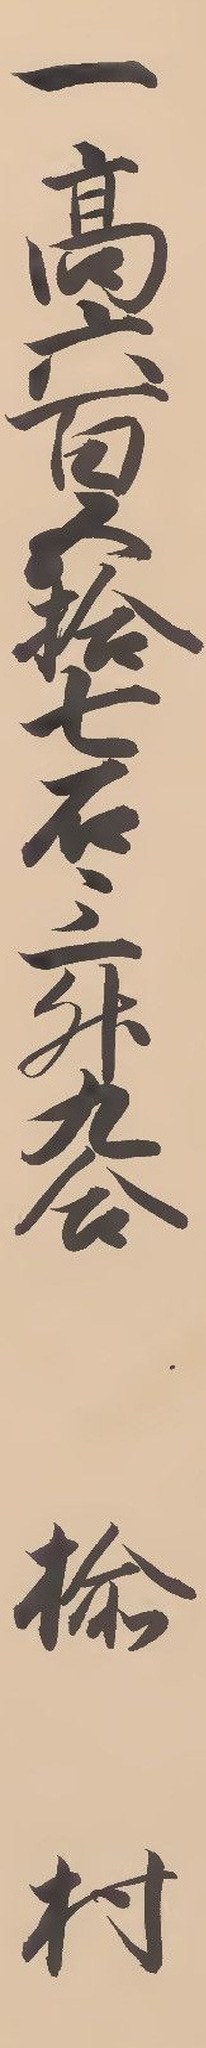一高六百五拾七石三升九合楡村
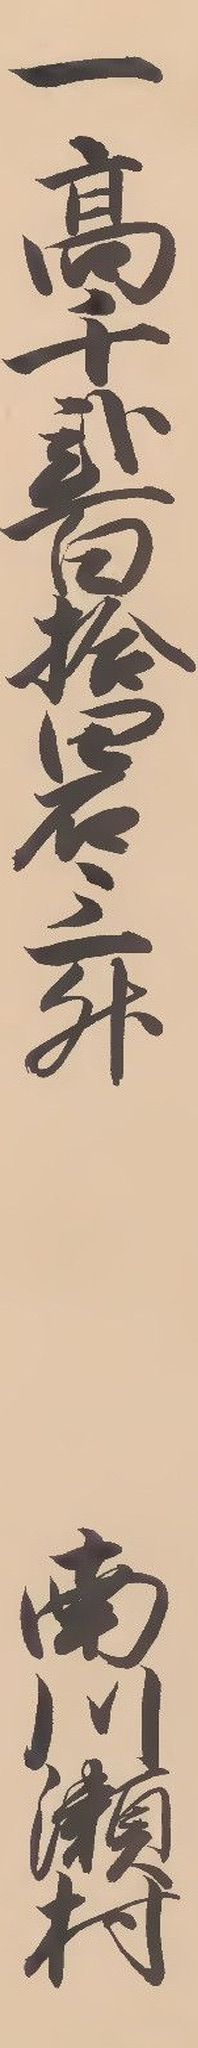一高千弐百拾四石三升南川瀬村
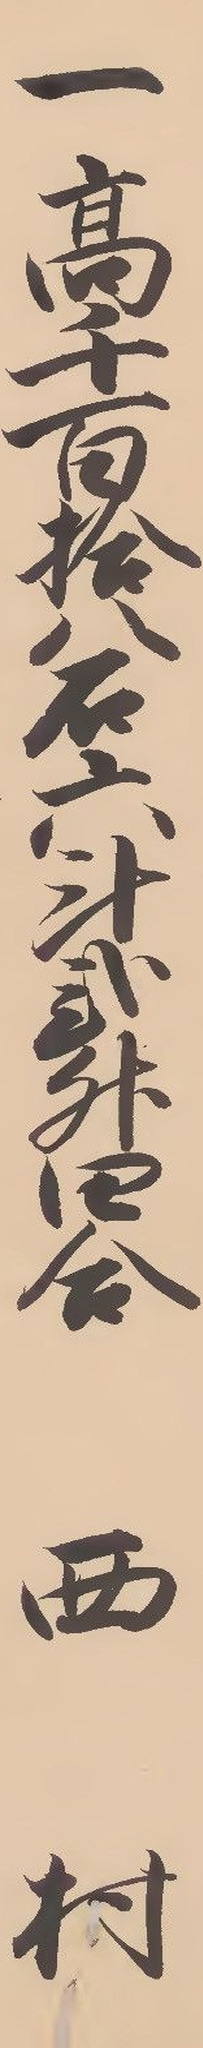一高千百拾八石六斗弐升四合西村
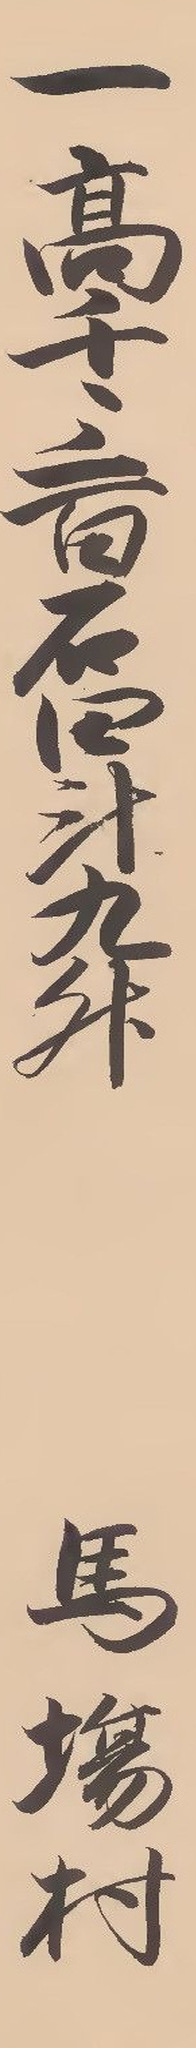一高千三百石四斗九升馬場村

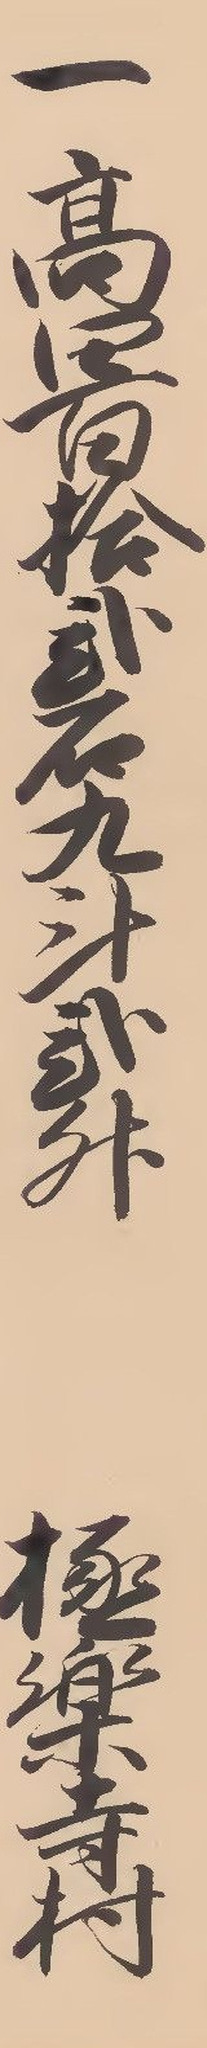一高四百拾弐石九斗弐升極楽寺村
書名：近江国郷帳
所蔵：国立公文書館 National Archives of Japan
